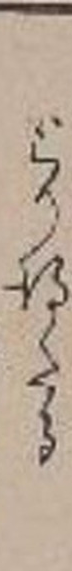とり得たる
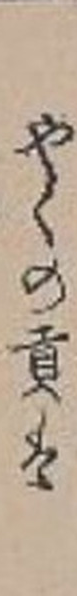やくの貢は
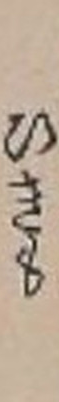ひきも

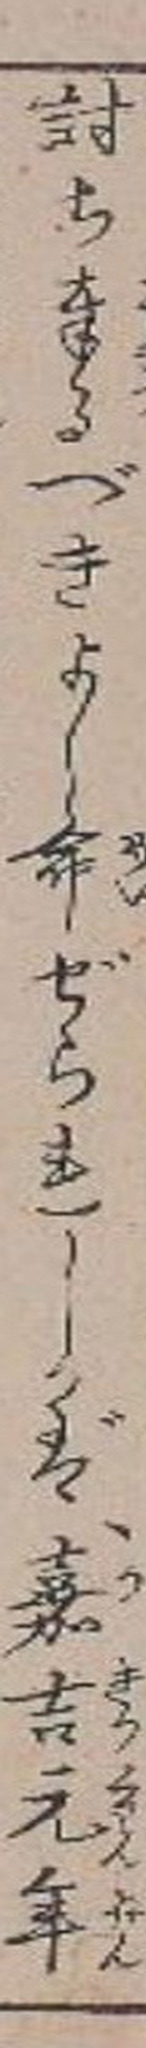討ち奉るべきよし命ぜられしかば、嘉吉元年
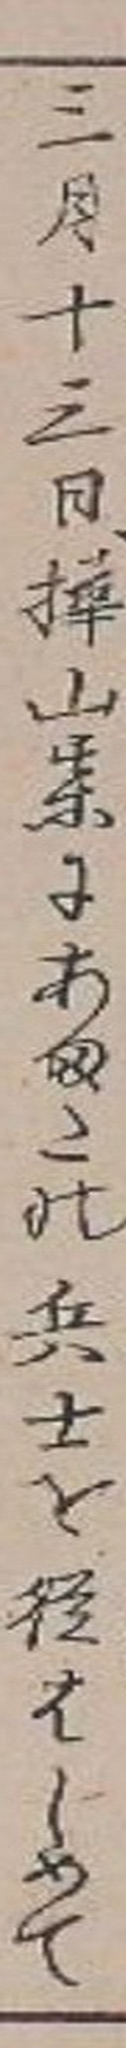三月十三日、樺山某にあまたの兵士を従はしめて
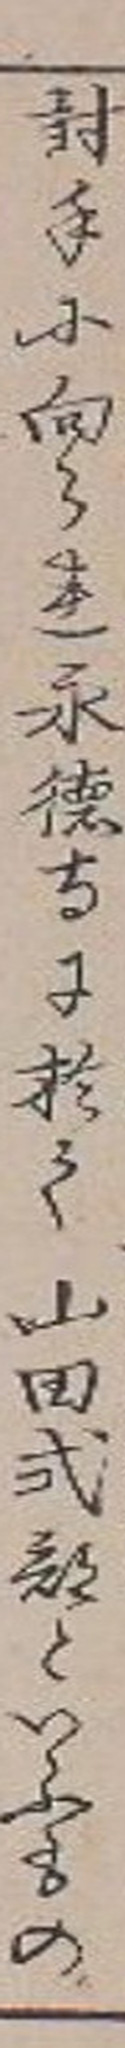討手に向られ、永徳寺に於て、山田式部といふもの
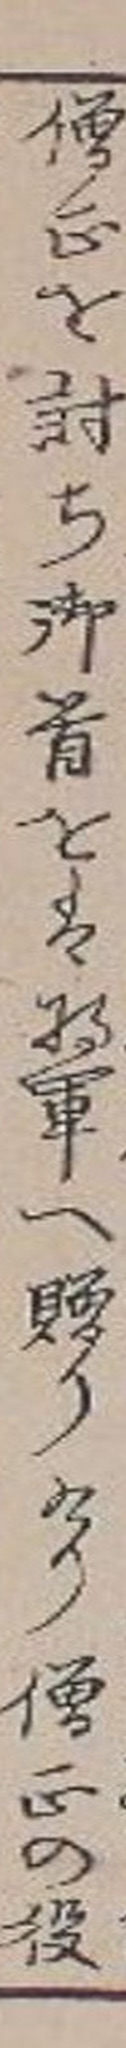僧正を討ち、御首をは将軍へ贈りけり、僧正の役
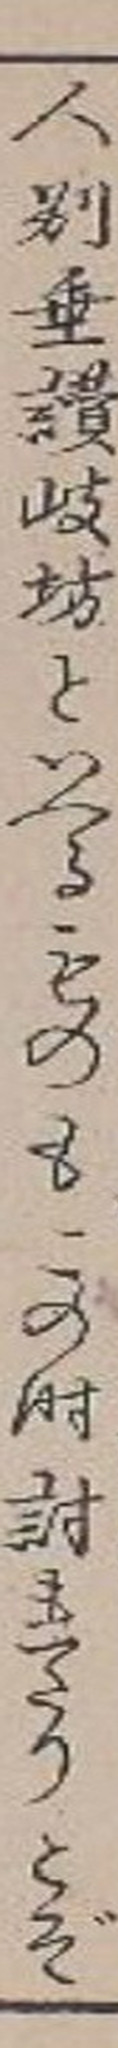人別垂讃岐坊といへるものも、この時討れたりとぞ
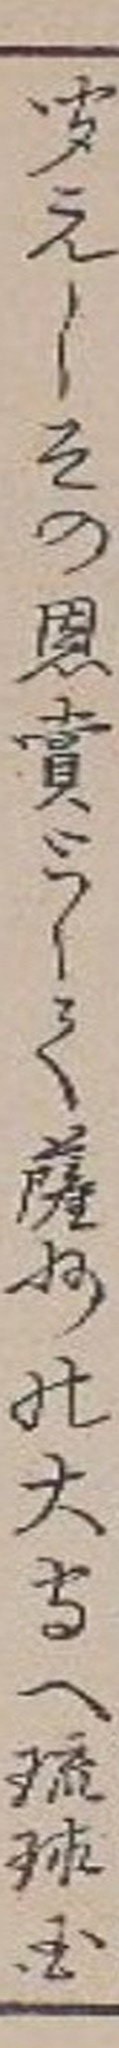聞えしその恩賞として、薩州の大守へ琉球国
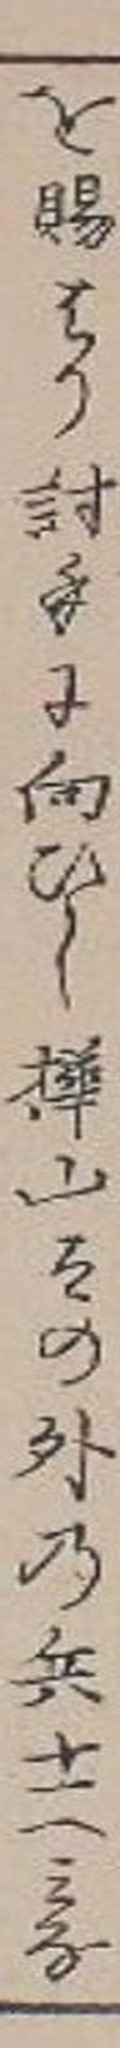を賜はり、討手に向ひし樺山その外の兵士へ、みな
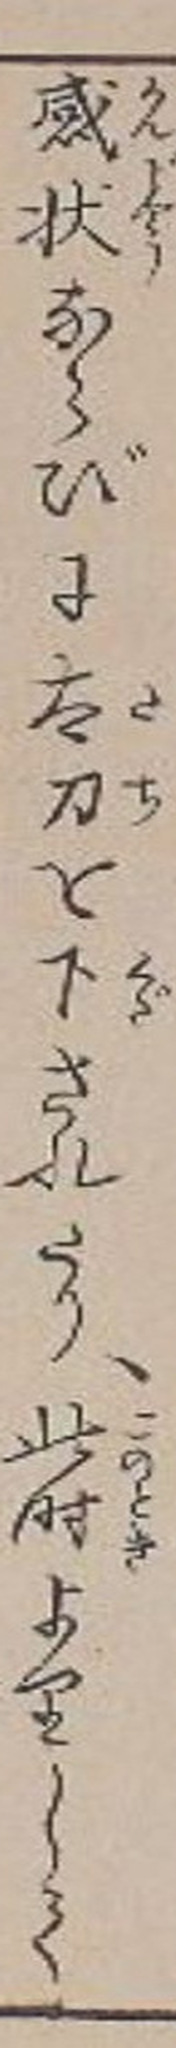感状ならびに太刀を下されたり、此時よりして
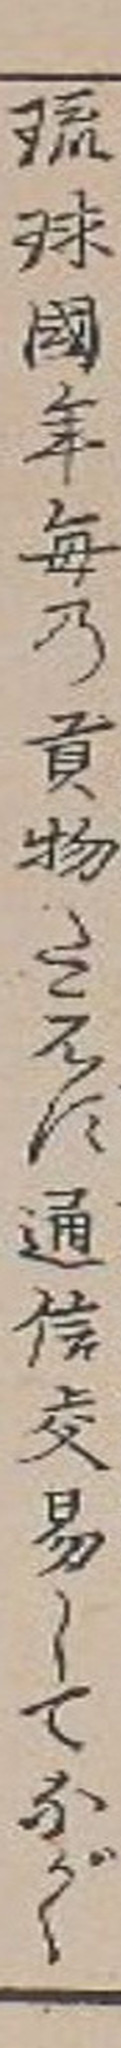琉球国年毎の貢物たえず、通信交易してながく
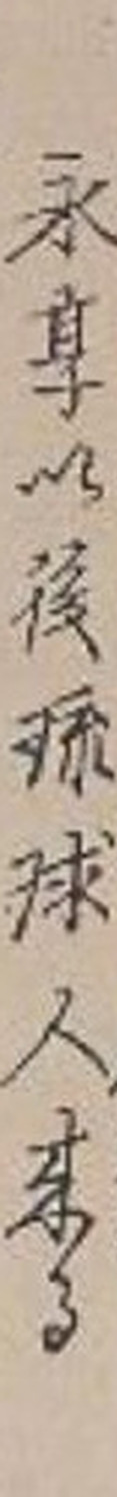永享以後琉球人来る
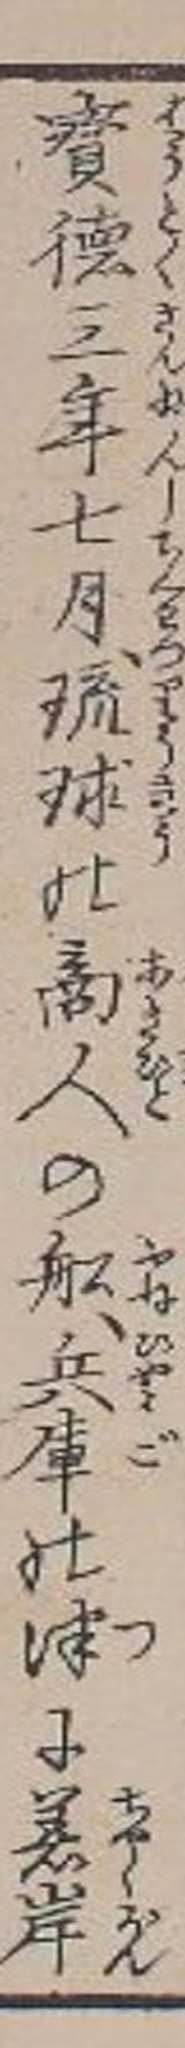宝徳三年七月、琉球の商人の船、兵庫の津に着岸
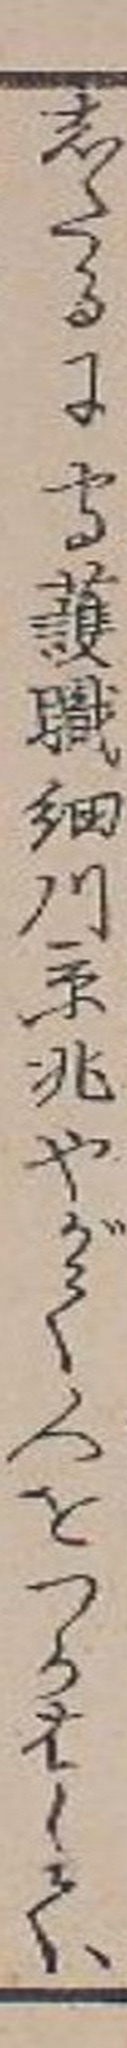したるに、守護職細川京兆やがて人をつかはして、
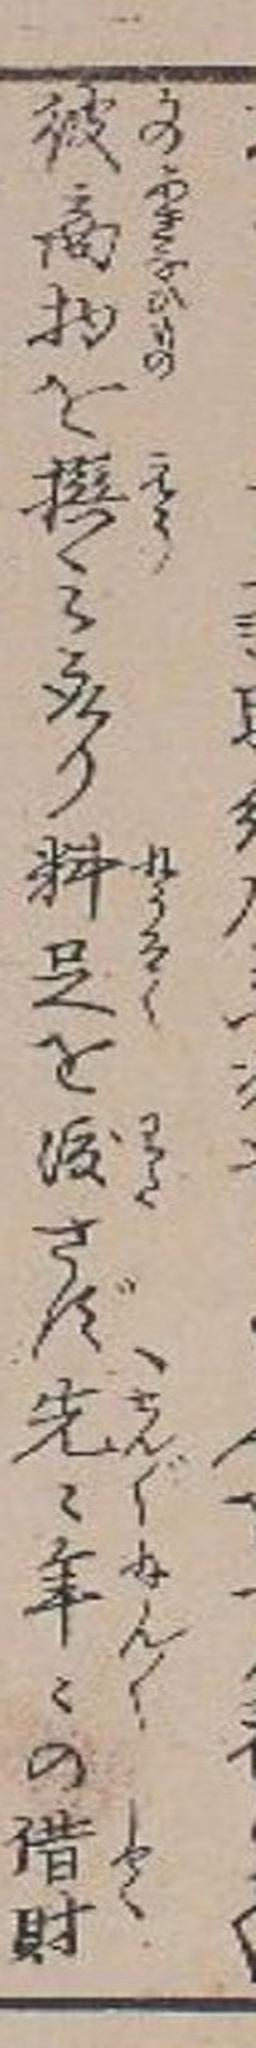彼商物を撰み取り料足を渡さず、先々年々の借財
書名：琉球入貢紀略
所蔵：University of the Ryukyus Library
